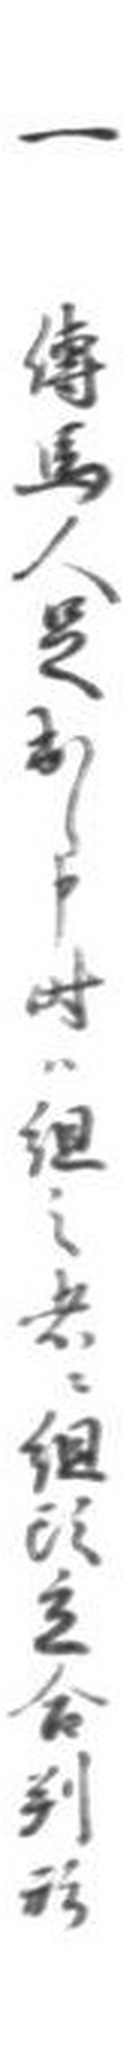一伝馬人足出し申時ハ組之者ニ組頭立合判形
